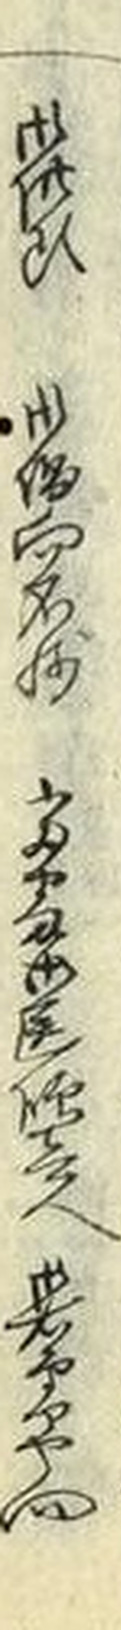御供頭御側向不残当番御医師壱人御右筆部屋向
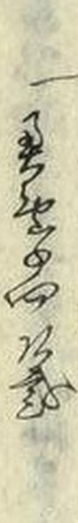奥台子向頂戴
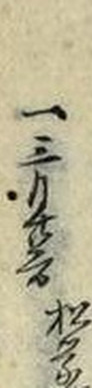一三月廿二日

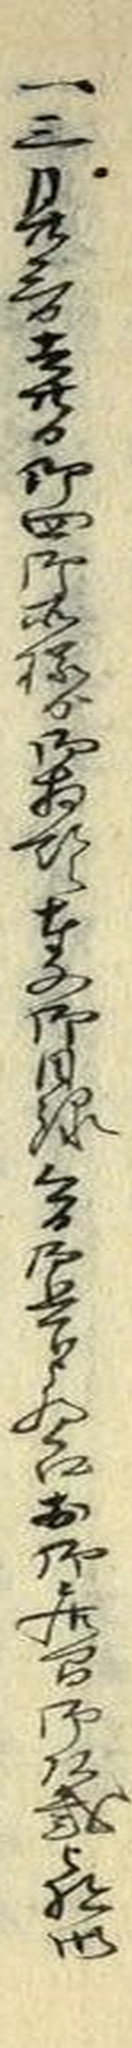一三月廿三日去廿日御四御所様ゟ御拝領之奉文御目録今日御上下被為召於御居間御頂戴被遊御
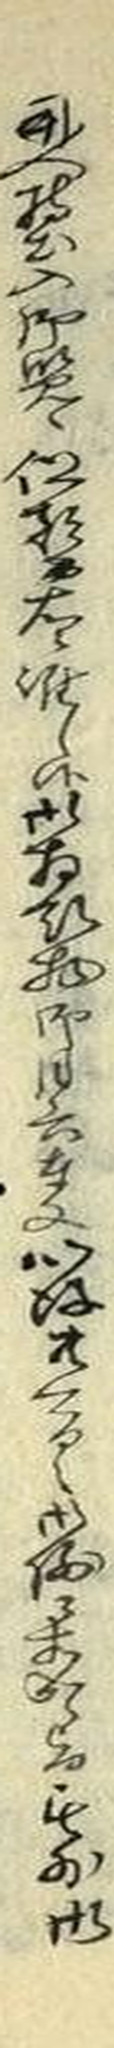用人持出入御覧候但都而右ニ准し候御拝領物御目六奉文以後共今日之御例ニ相成候旨其外御
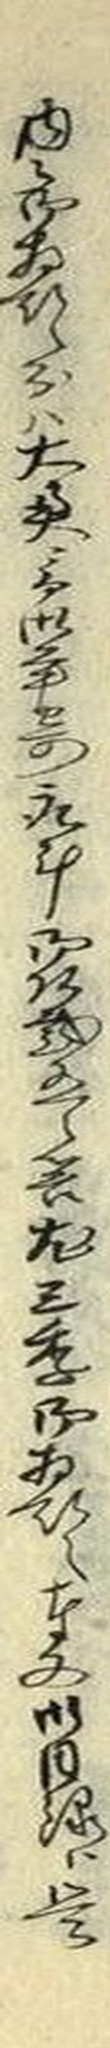内々御拝領之分ハ大奥ニ而御年寄取計御頂戴有之筈尤三季御拝領之奉文御目録ハ是
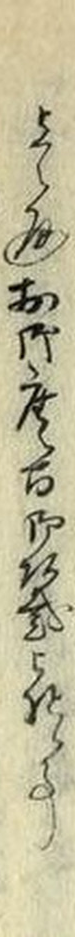迄之通於御座之間御頂戴被遊候事
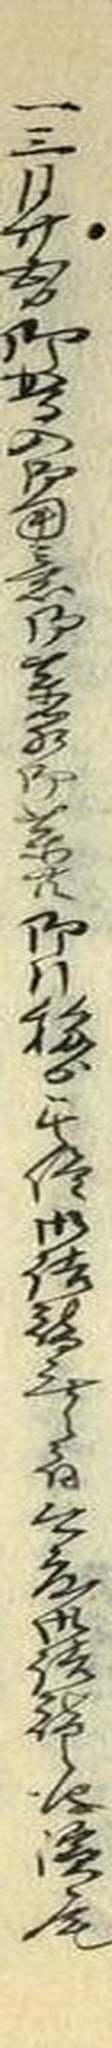一三月廿五日御駕入御用意御薬箱御薬共御引移ゟ其儘御詰替無之ニ付今度御詰替之儀浜尾
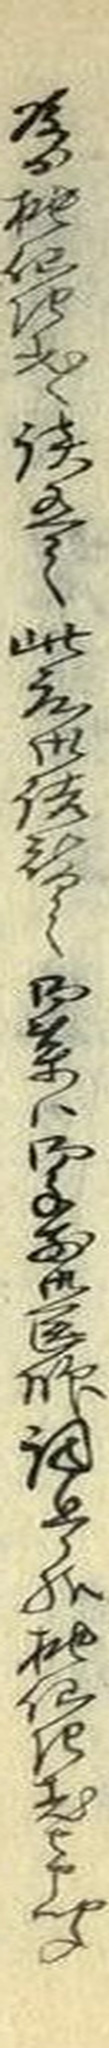殿ゟ桃仙院老へ談有之此度御詰替之御薬ハ御手前御医師調上候様桃仙院老被申聞
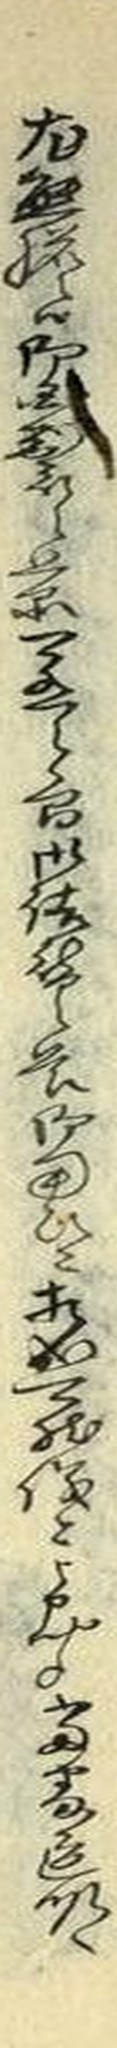尤熊膽ハ御国製之上品可有之候間御詰替之節御用いニ相成可然儀と被申聞当番道順へ
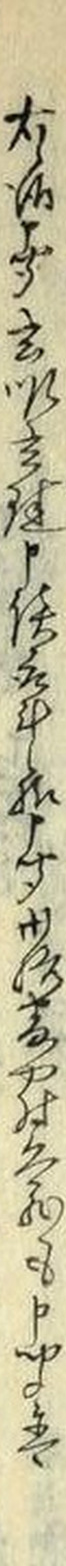右之趣申聞玄順玄珪申談取計候様申聞御膳番中村久蔵へも申聞置候
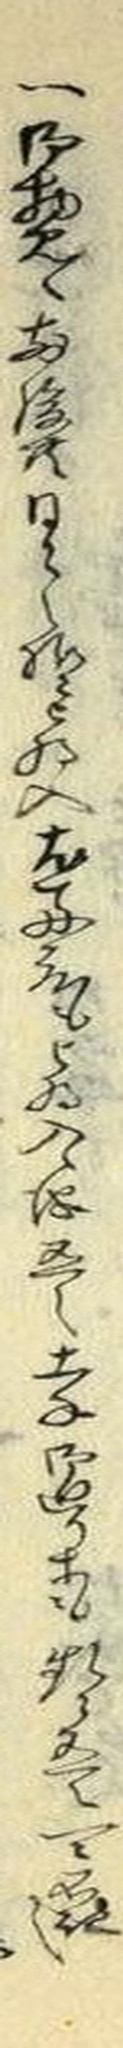一御物見へ前後共日々之様ニ被為入尤両度も被為入候儀有之土手御廻り等も頻々有之一々不記之
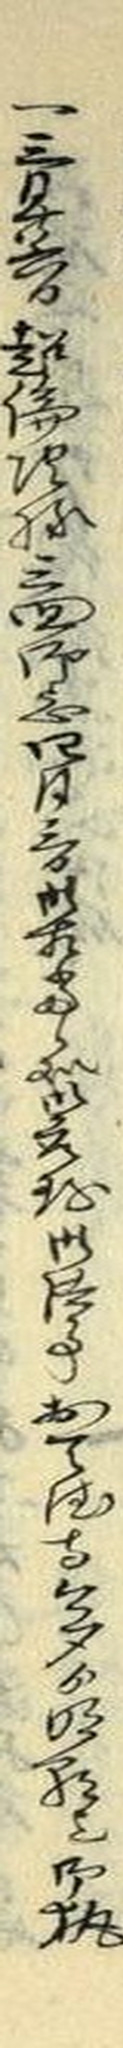一三月廿六日超倫院様三回御忌四月三日御相当之処御取越御法事於天徳寺今夕ゟ明朝迄御執
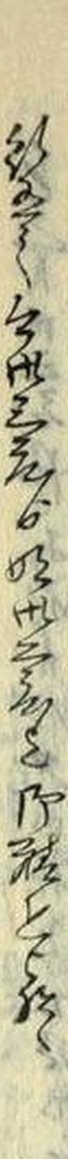行有之今御三度ゟ明御二度迄御精進被遊候
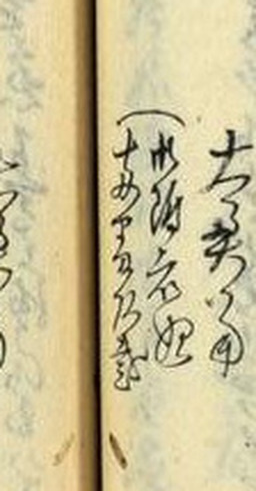両番頂戴
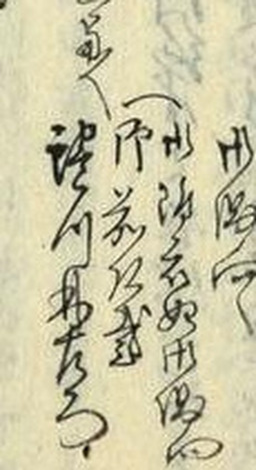御前頂戴
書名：少傅日録抄（斉善付側向頭取日記、在府）
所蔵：福井県文書館 Fukui Prefectural Archives
